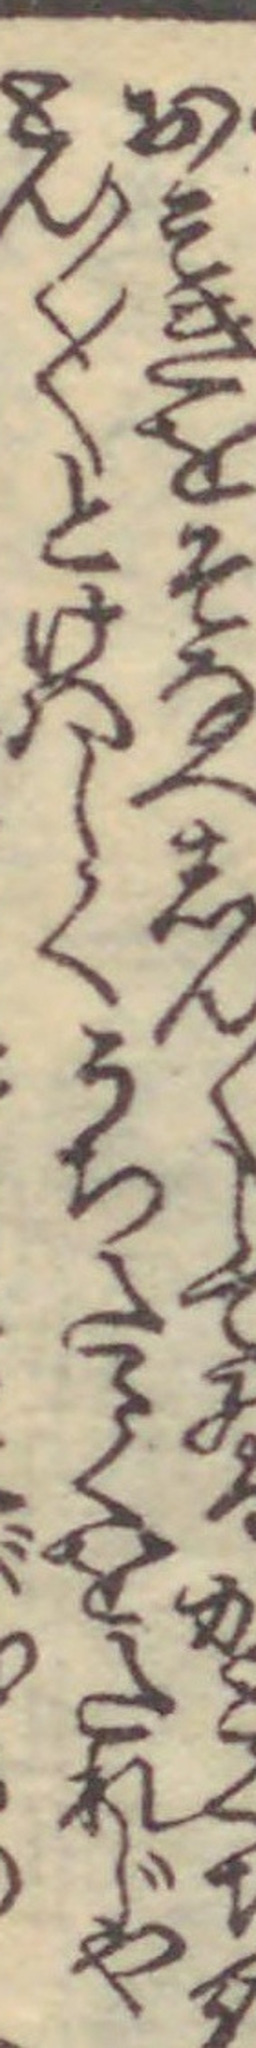とん〳〵〳〵とけはしくうちたゝくをたれじや
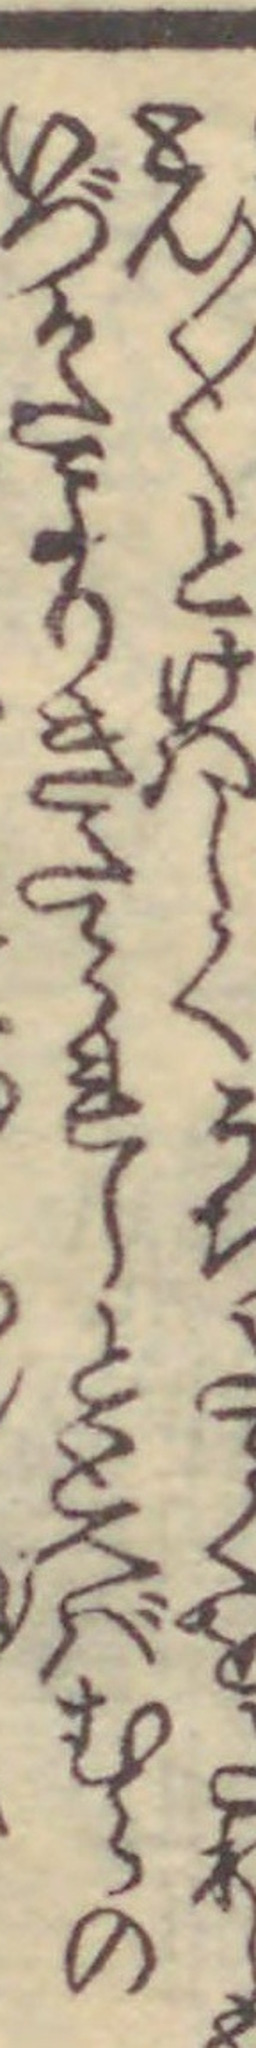いづかたよりきたられしととへばむらの
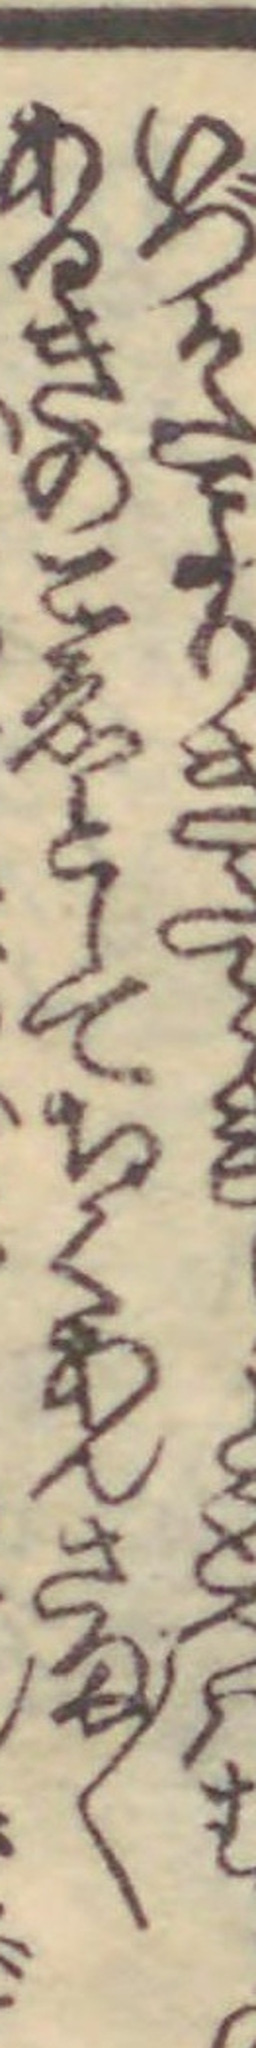あるきのこゑとしてちくあんさま〳〵
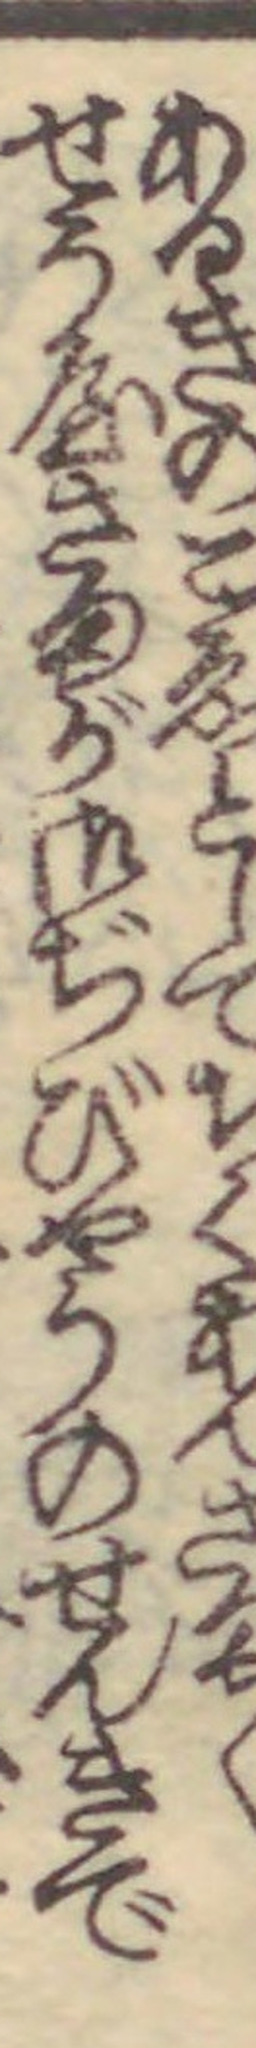せう屋さまが御ぢびやうのせんきで
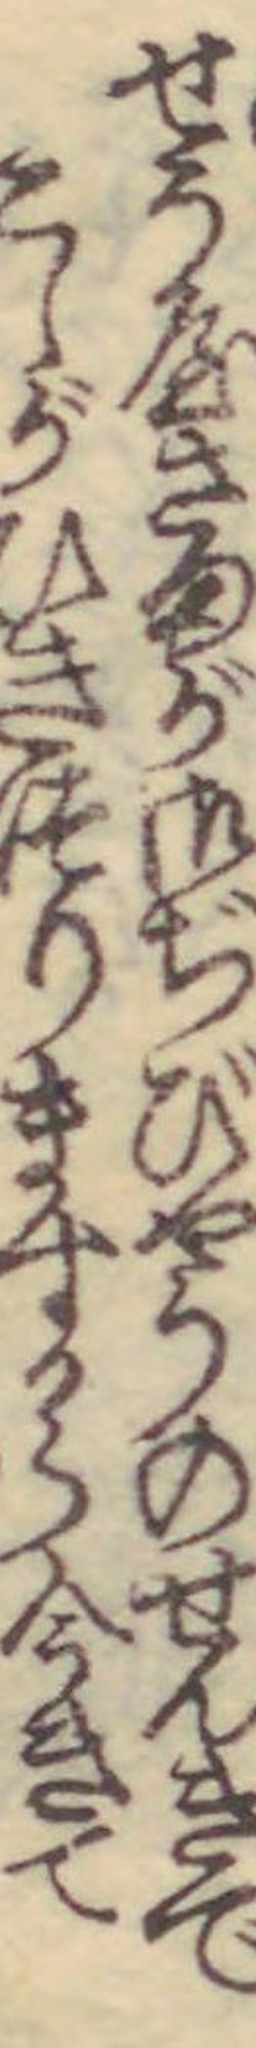こしがひきつりますから今きて
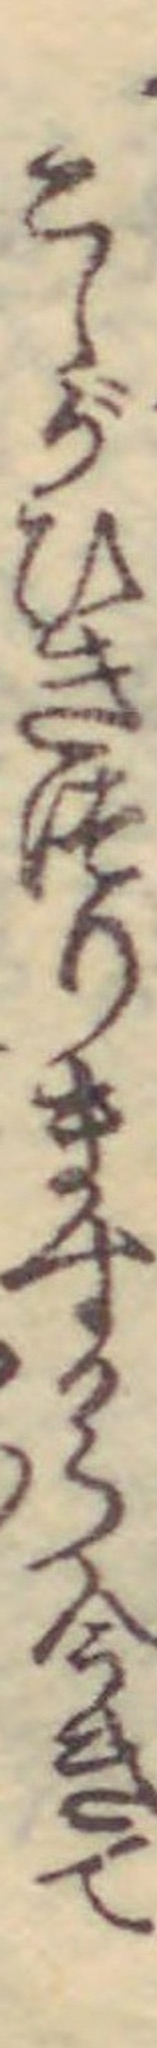こしがひきつりますから今きて
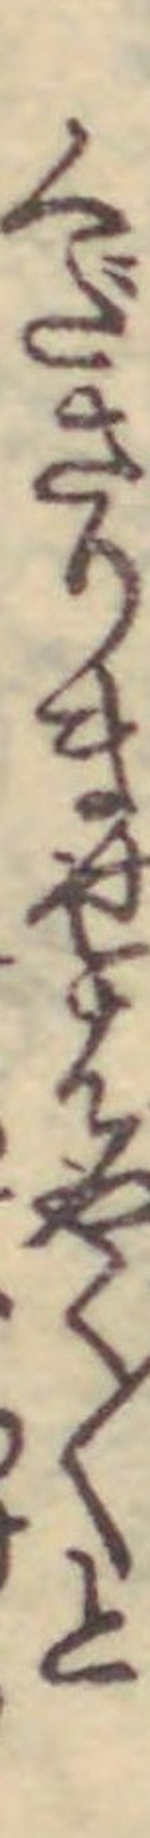くださりませはやく〳〵と
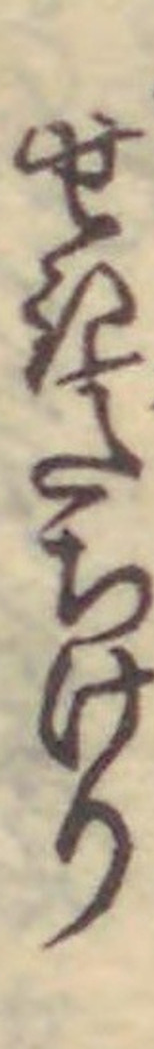せきたちけり

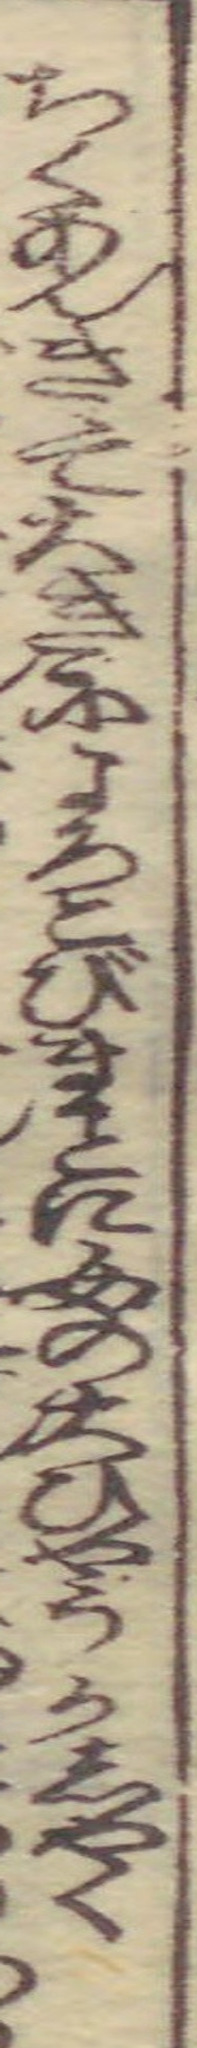ちくあんきゝて大きによろこびまことに女の大ひやうかしやく
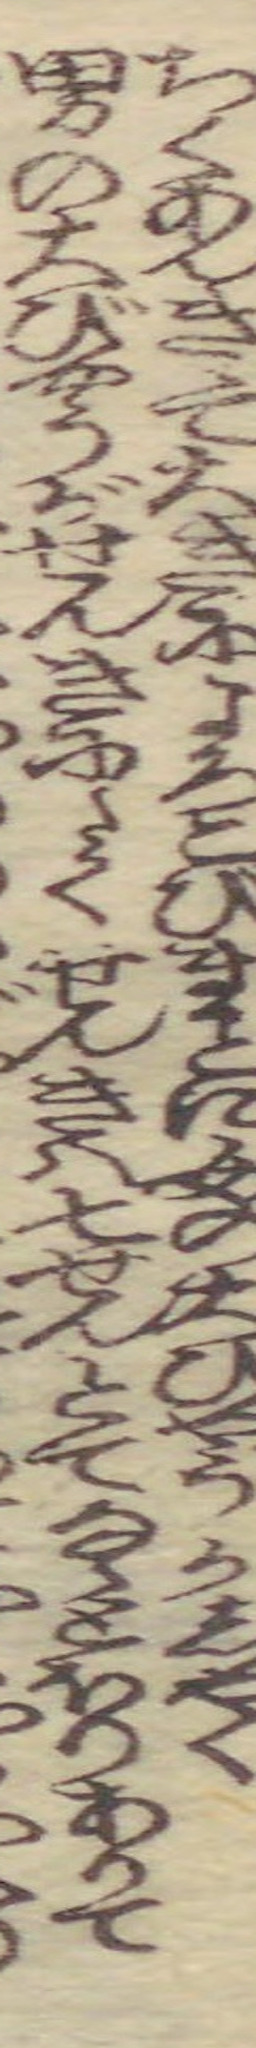男の大びやうがせんきにしてせんきは七せんとてなゝとほりありて
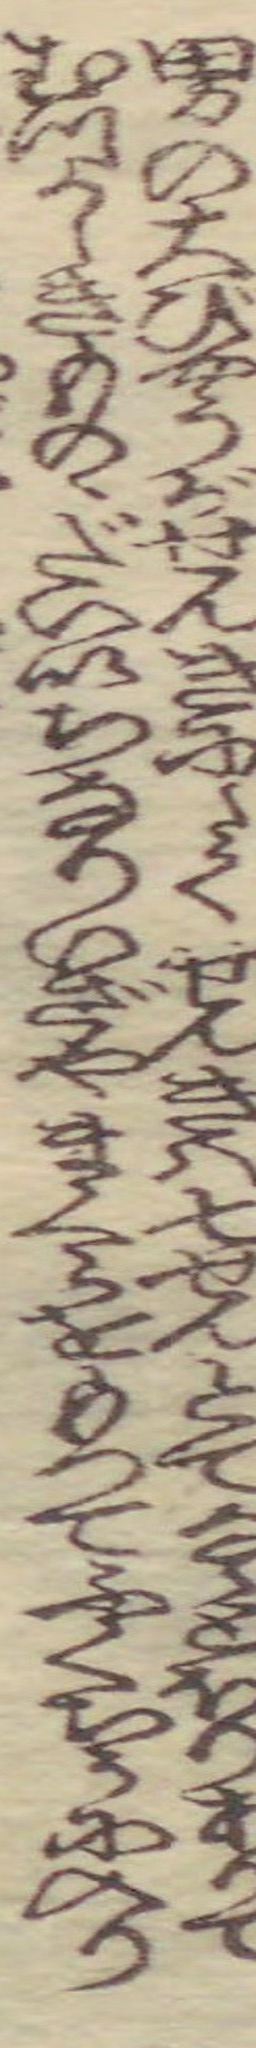むつかしきものゝだいいちなりいざやまくらをもつてふくちうに入り
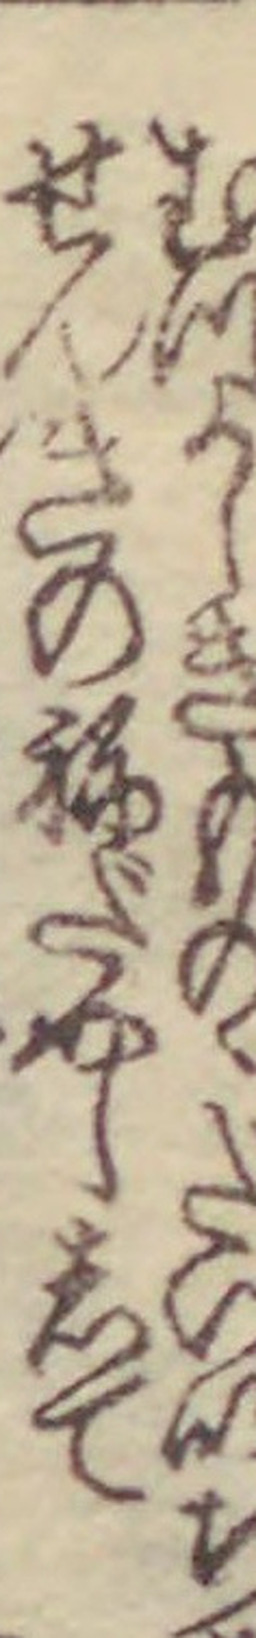せんきのねだやしして
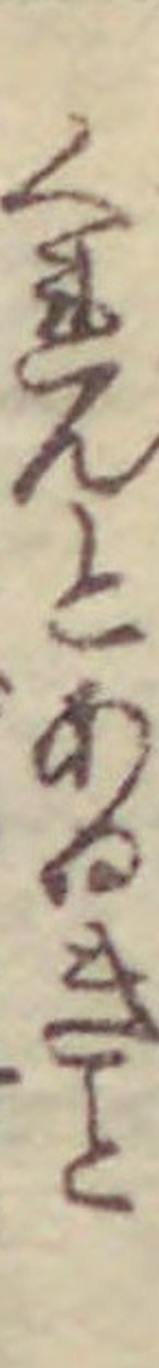くれんとあるきと
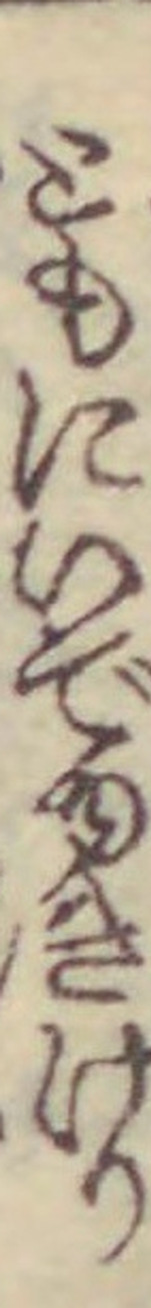ともにいでゆきけり
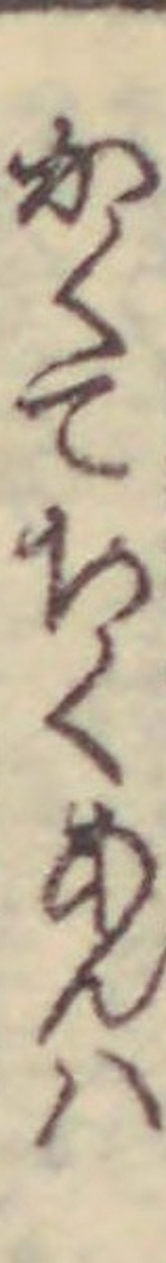かくてちくあんは
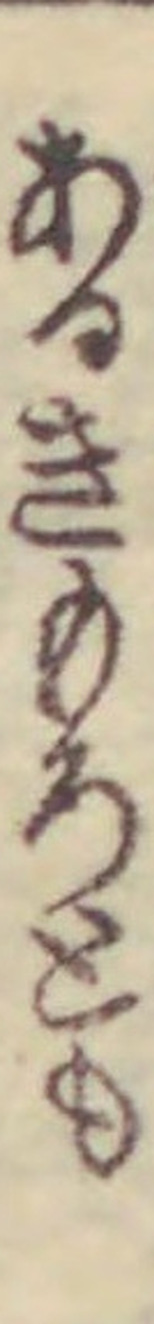あるきもろとも
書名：腹内窺機関 2巻
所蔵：国立国会図書館 National Diet Library, JAPAN
